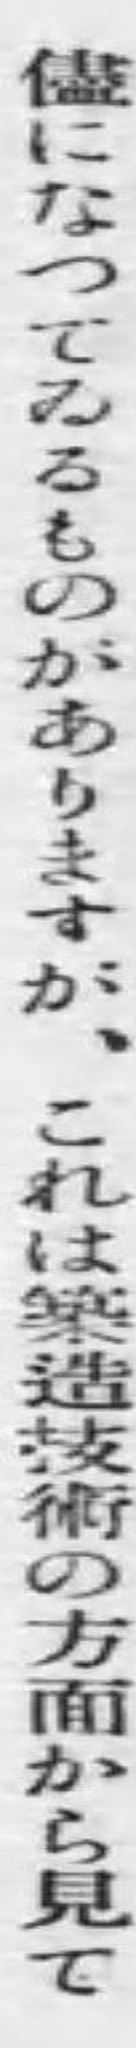侭になつてゐるものがありますが、これは築造技術の方面から見て
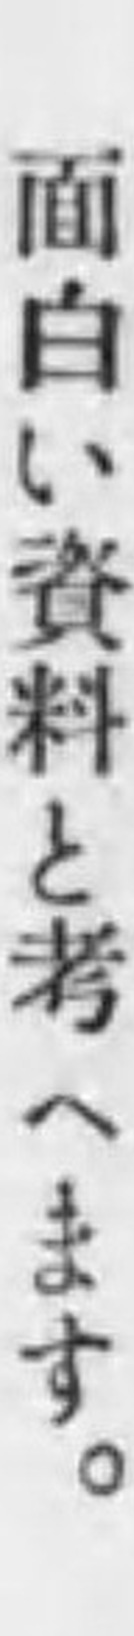面白い資料と考へます。
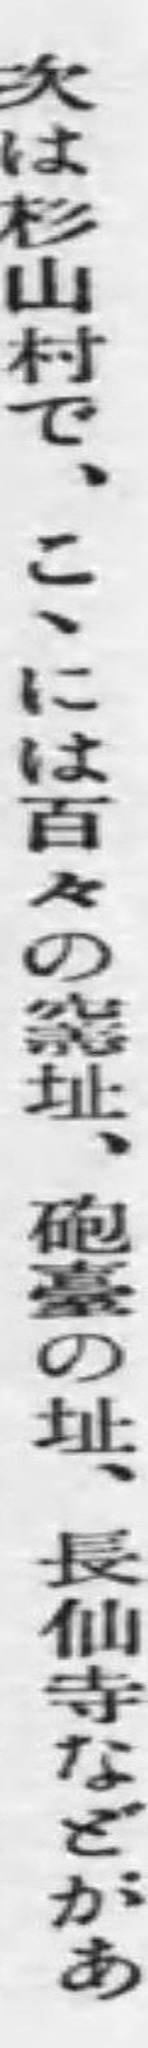次は杉山村で、こゝには百々の窯址、砲台の址、長仙寺などがあ
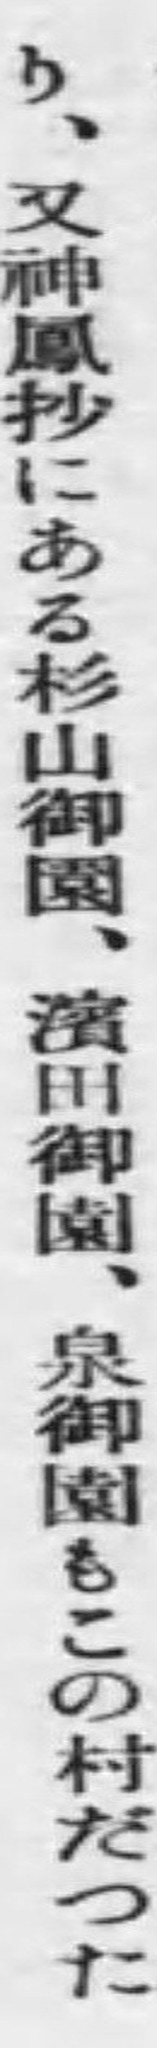り、又神鳳抄にある杉山御園、浜田御園、泉御園もこの村だつた
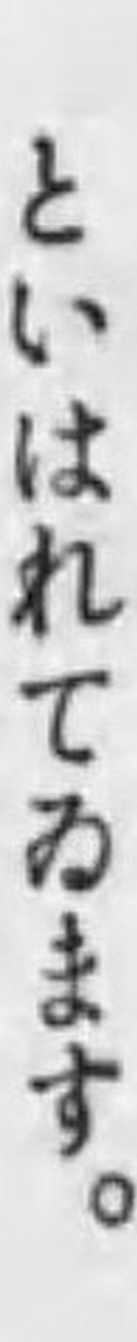といはれてゐます。
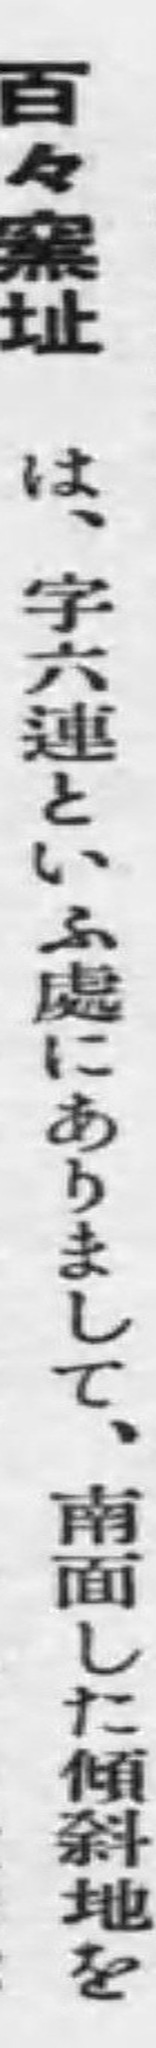百々窯址は、字六連といふ処にありまして、南面した傾斜地を
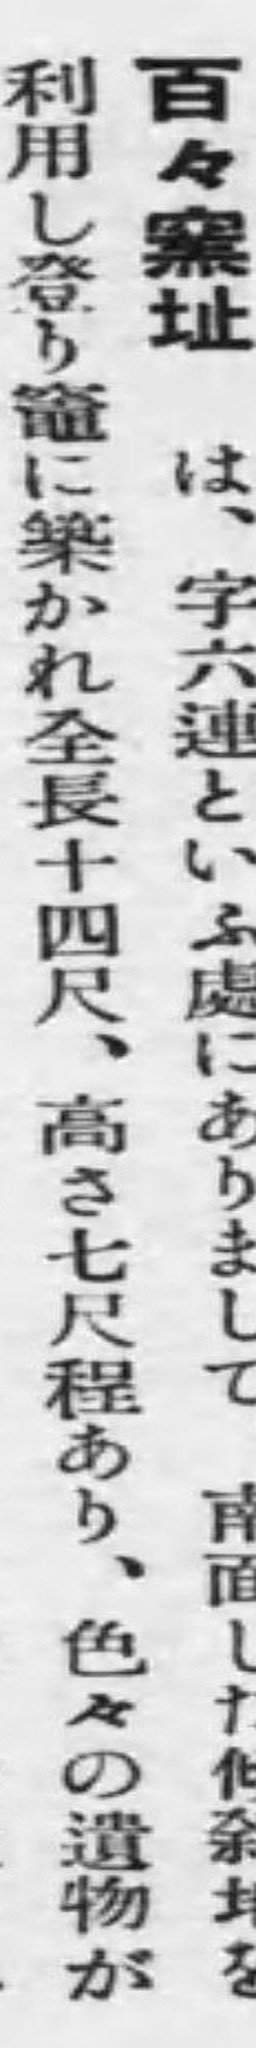利用し登り竈に築かれ全長十四尺、高さ七尺程あり、色々の遺物が
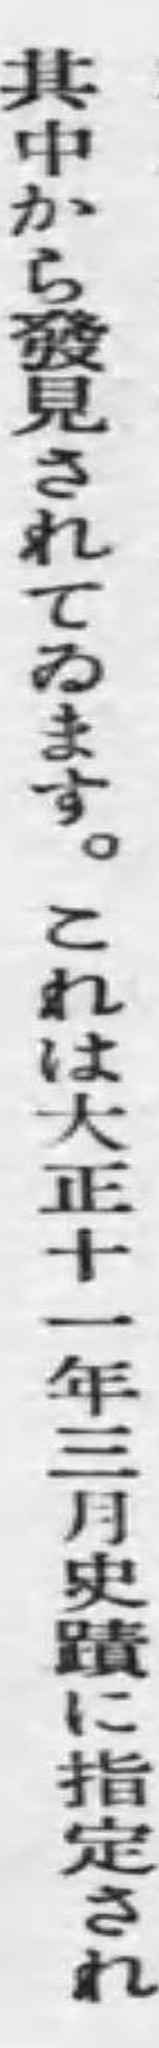其中から発見されてゐます。これは大正十一年三月史蹟に指定され
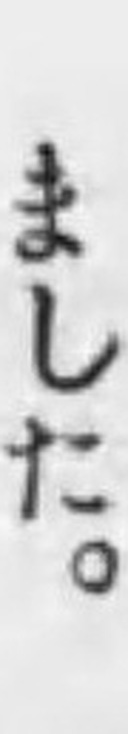ました。
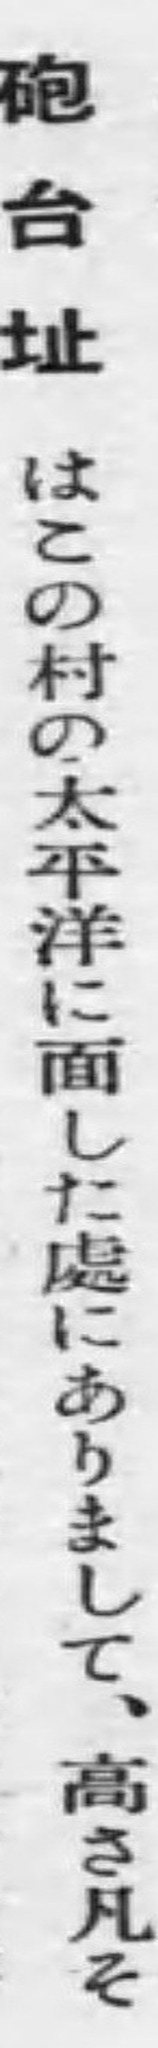砲台址はこの村の太平洋に面した処にありまして、高さ凡そ
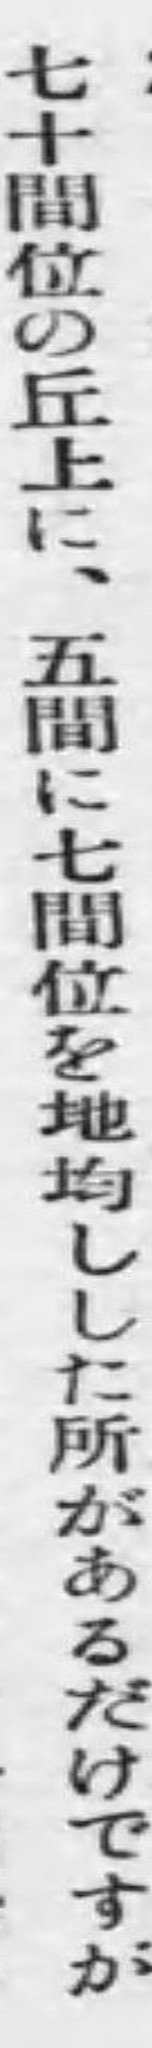七十間位の丘上に、五間に七間位を地均しした所があるだけですが
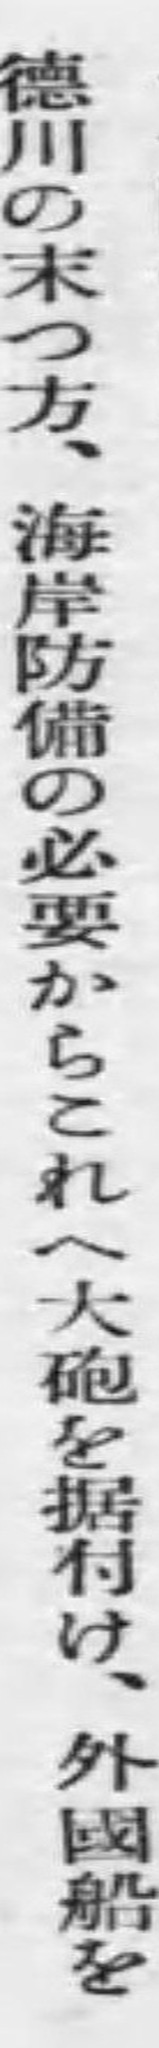徳川の末つ方、海岸防備の必要からこれへ大砲を据付け、外国船を
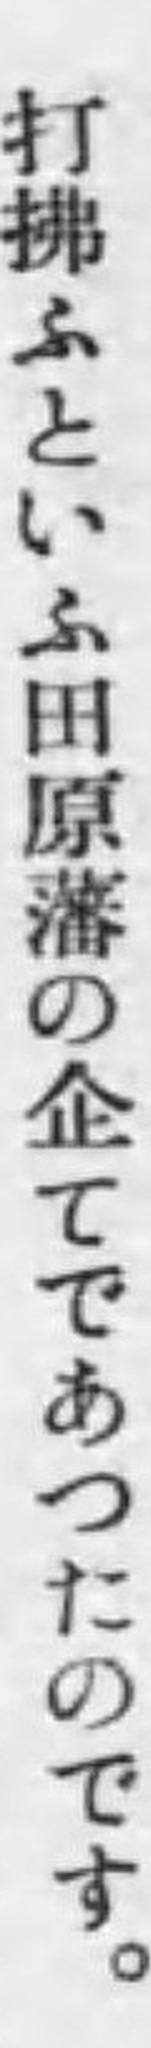打払ふといふ田原藩の企てであつたのです。
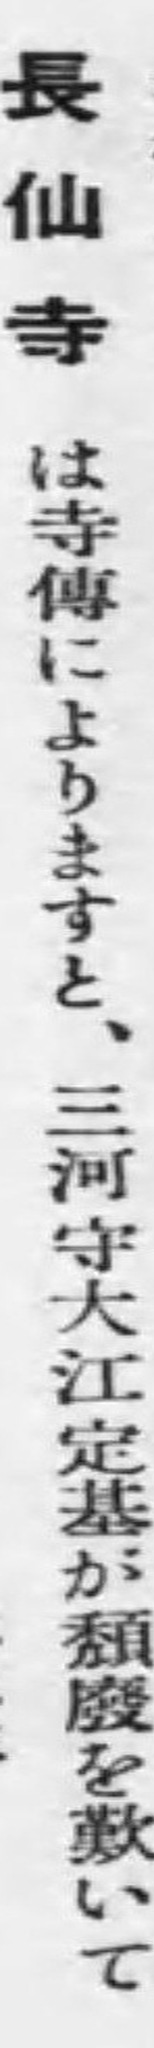長仙寺は寺伝によりますと、三河守大江定基が頽廃を歎いて
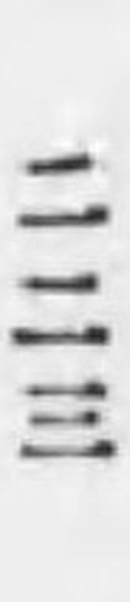二二三

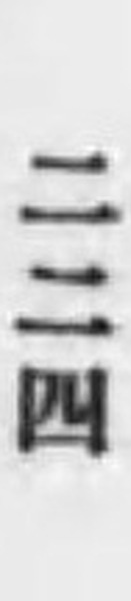二二四
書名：東三河道中記 : 豊橋市及其附近案内
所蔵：国立国会図書館 National Diet Library, JAPAN
